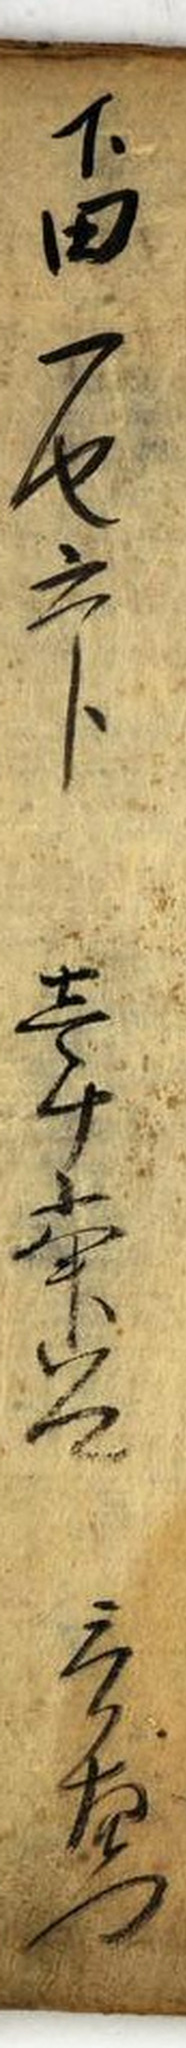下田一セ六分壱斗六升八合三郎左衛門
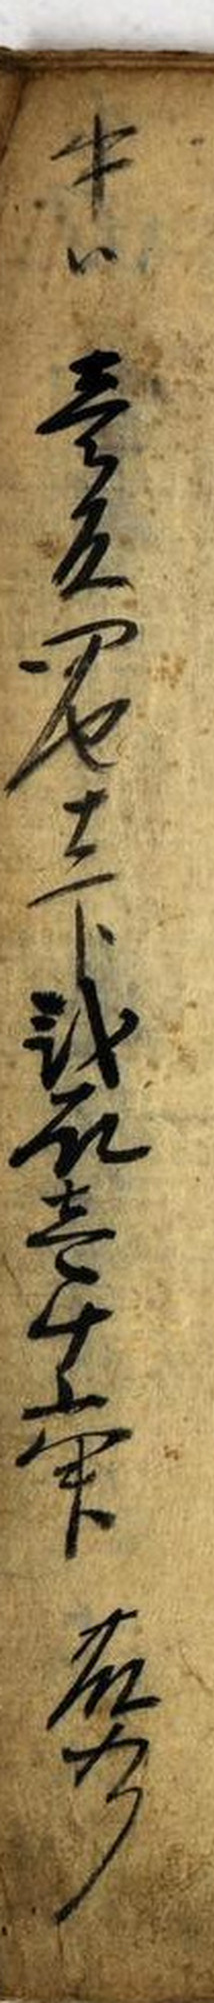中同壱反四セ十二分弐石壱斗六升藤九郎

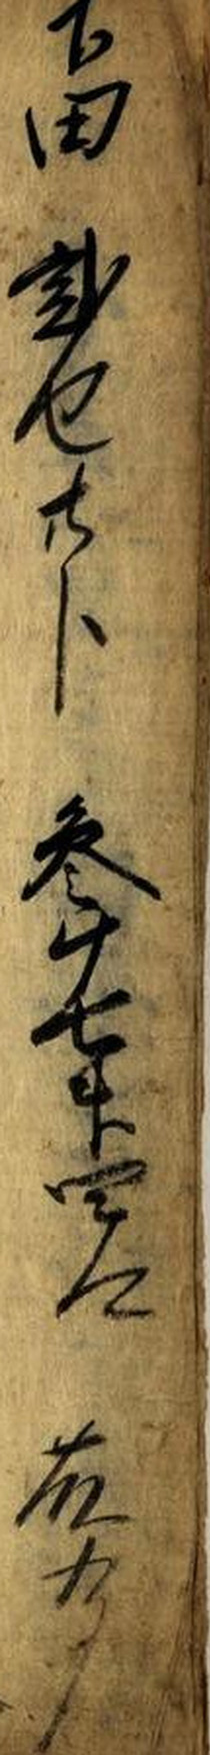下田弐せ廿分参斗七升四合藤九郎
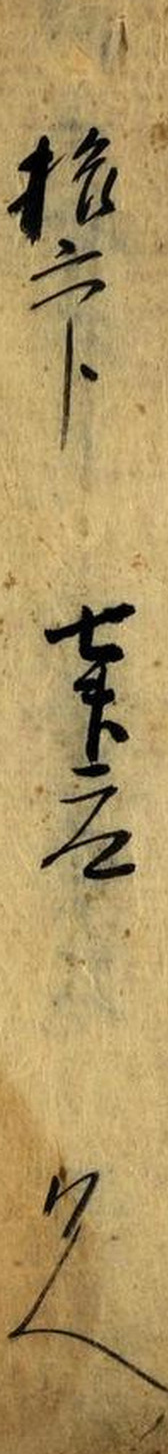同拾六分七升二合同人
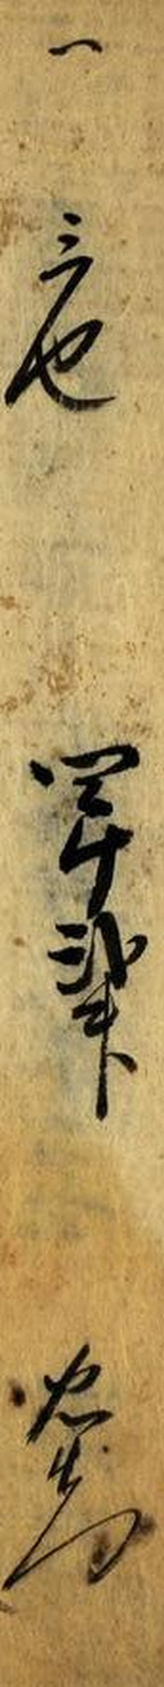同三セ四斗弐升忠右衛門
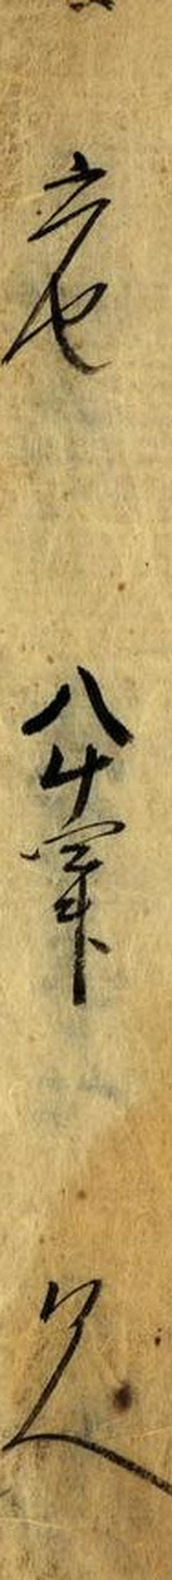同六セ八斗四升同人
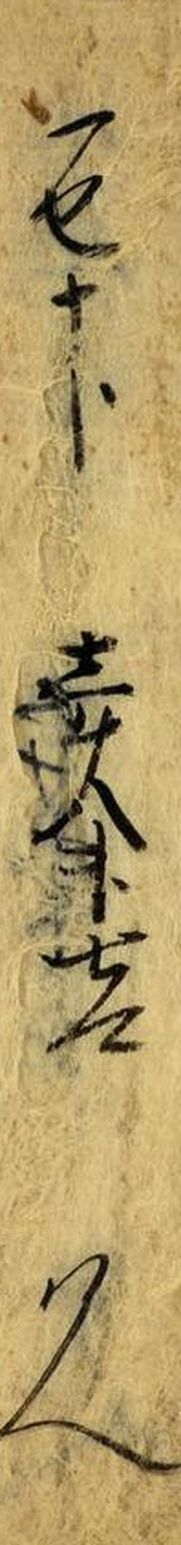同一セ十分壱斗八升七合同人
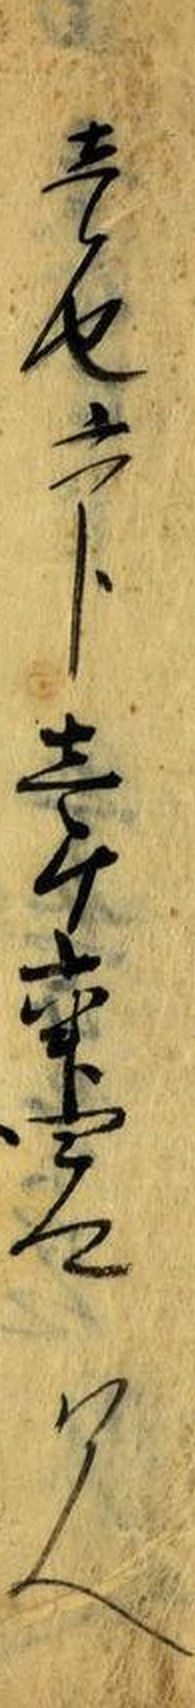同壱せ六分壱斗六升四合同人
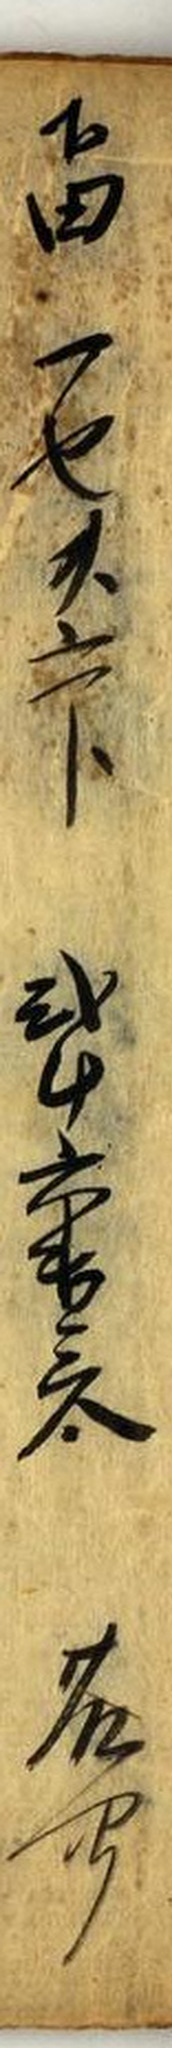下田一セ廿六分弐斗六升三合藤四郎
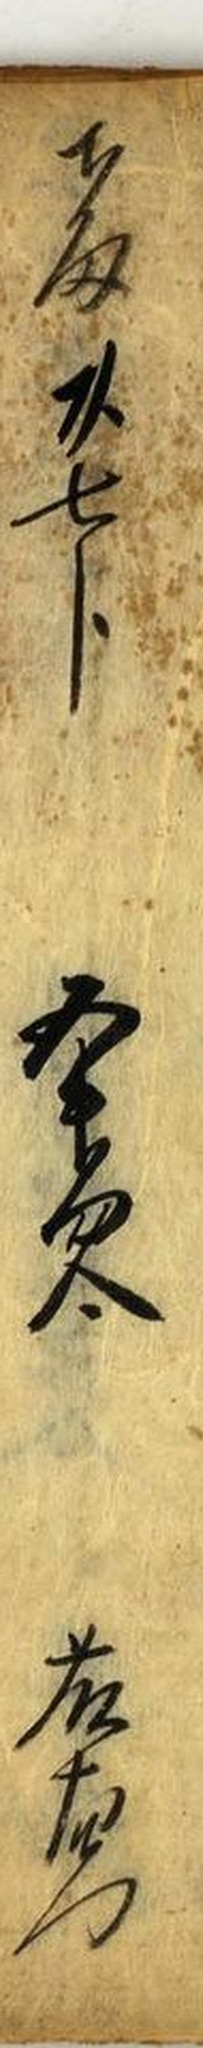下畠廿七分五升四合藤左衛門
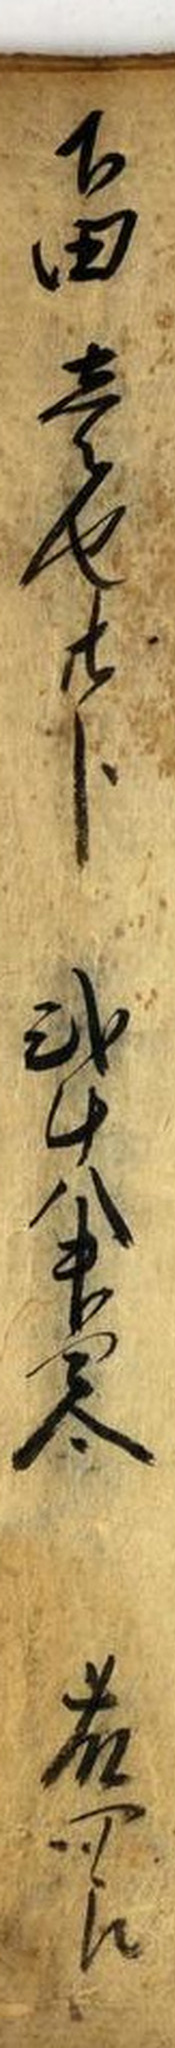下田壱セ廿分弐斗八升四合藤四郎
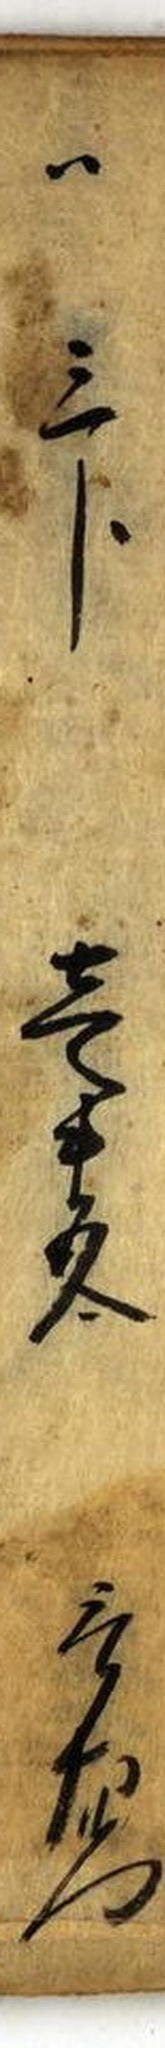同三分壱升五合三郎左衛門
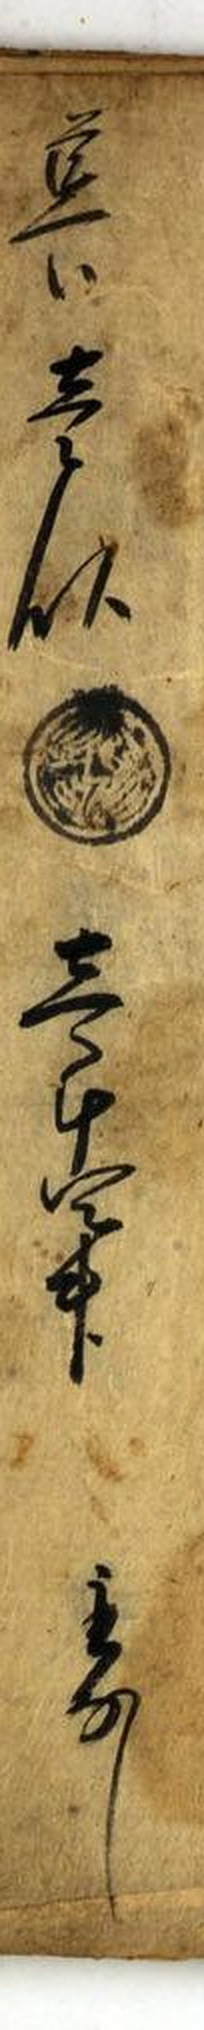荒同壱畝㊞壱斗四升主なし
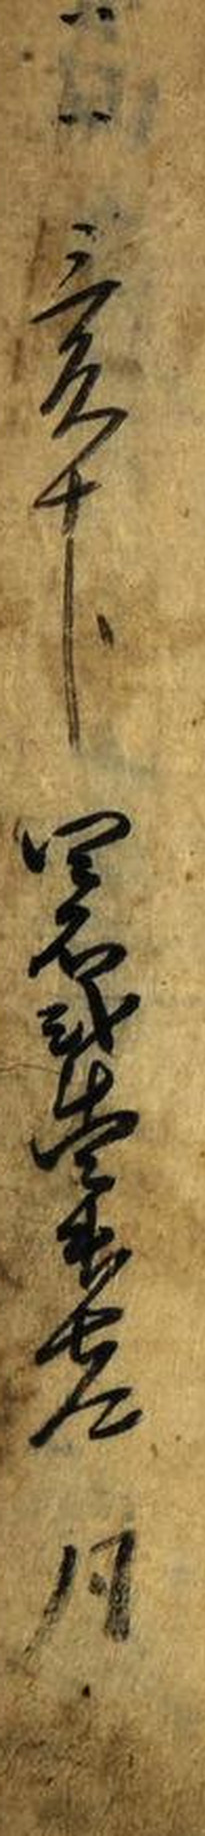同三反十分四石弐斗四升七合同
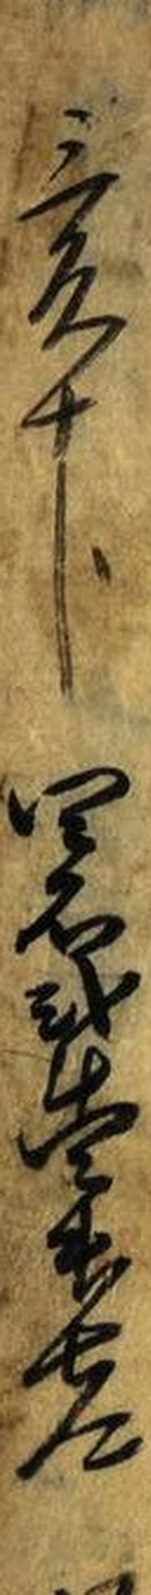同三反十分四石弐斗四升七合同

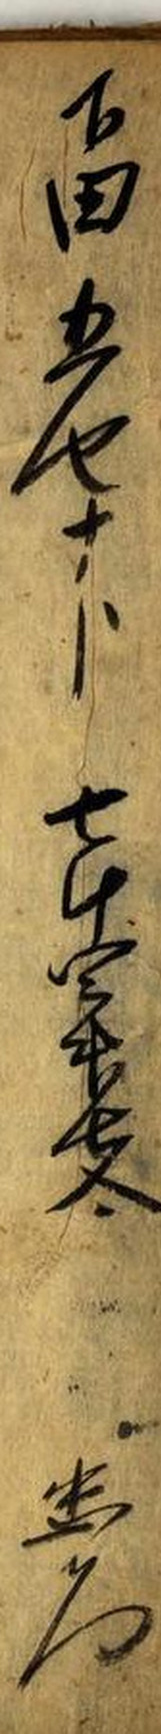下田五セ十分七斗四升七合生右衛門
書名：越前国西方内志津庄内本折村御検地帳
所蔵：福井県文書館 Fukui Prefectural Archives
